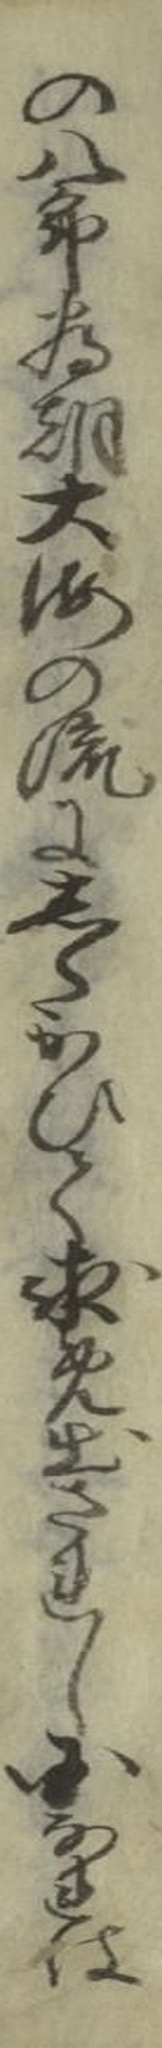の八争為朝大海の流にしたかひて求め出されし国なれは
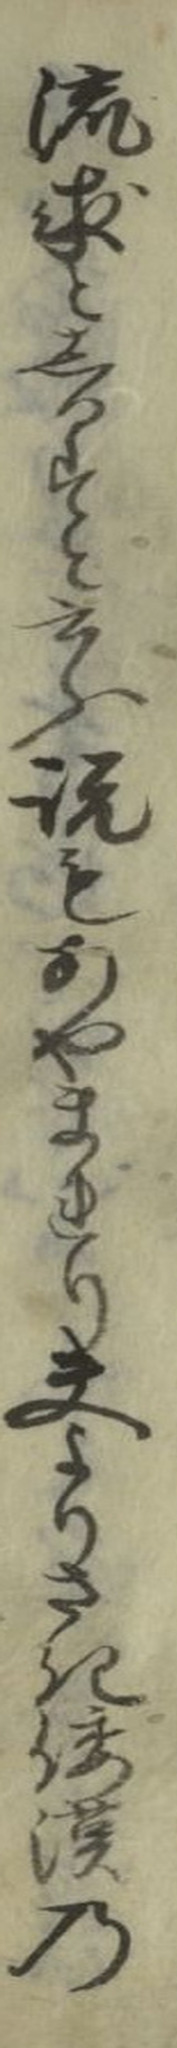流求としるすと云うせ説もあやまれり夫よりさき倭漢の
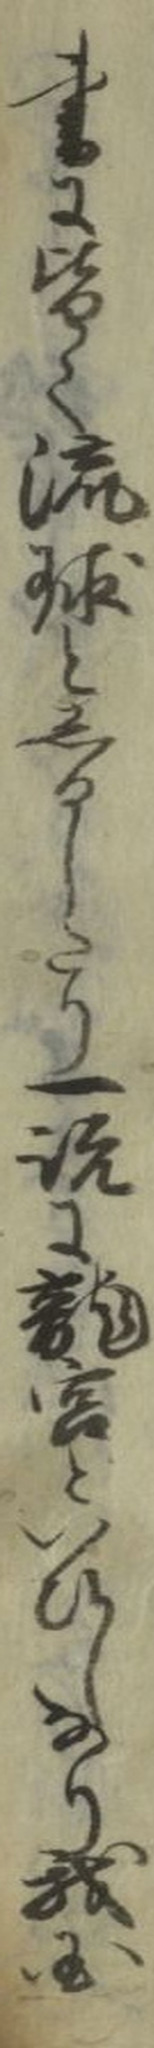書に皆て琉球としるしたり一説に龍宮といひしなり我国

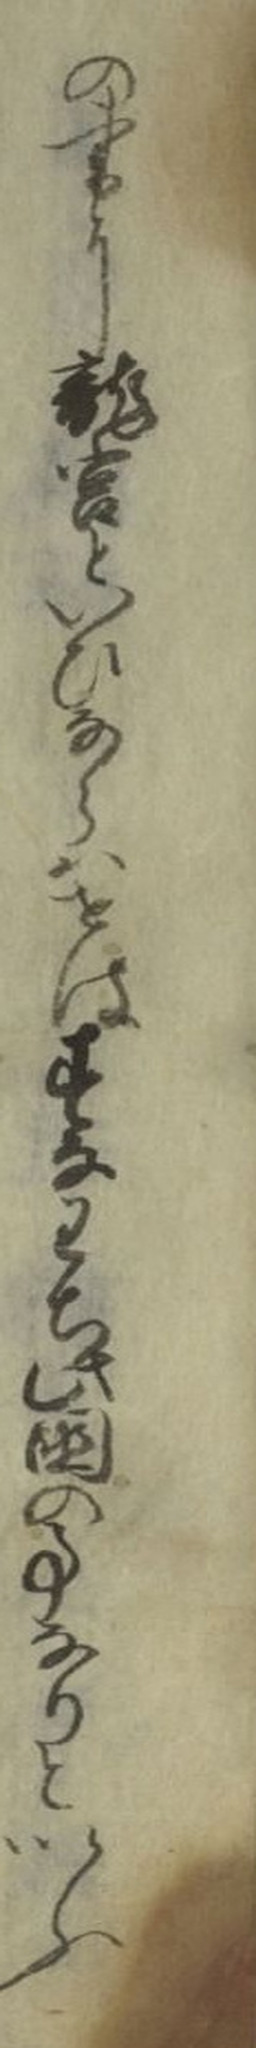の書に龍宮といひならわさはすなわち此国の事なりといふ
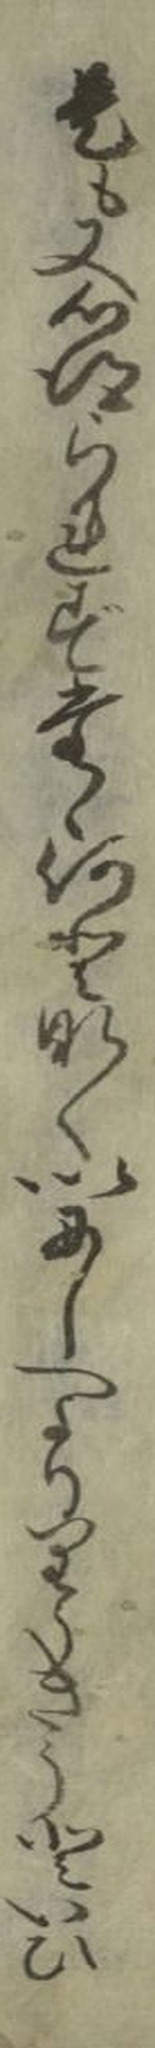是も又心得られずたゝ何となくいにしへよりりうきういひ
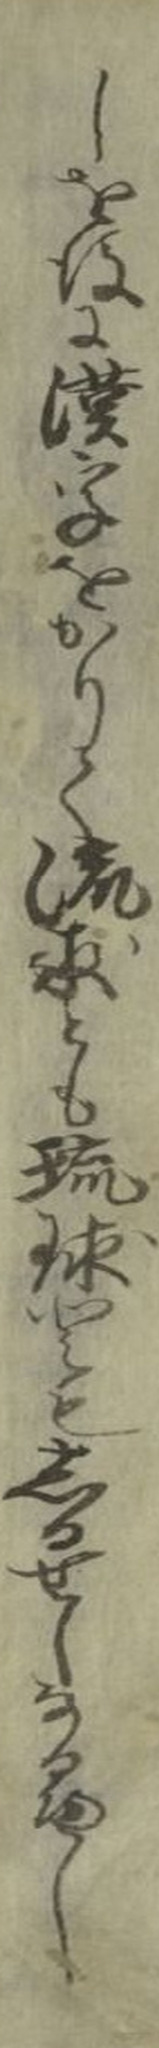しを後に漢字をかりて流求とも琉球ともしるせしなるへし
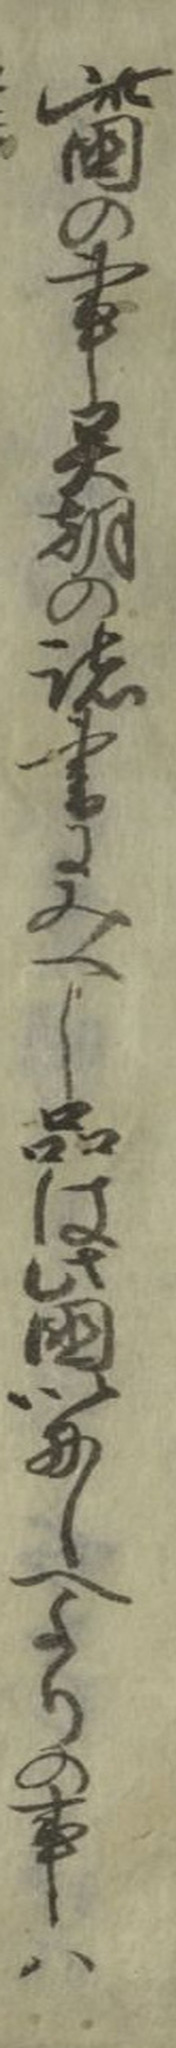此国の事異朝の諸事にみへし品は此国いにしへよりの事は
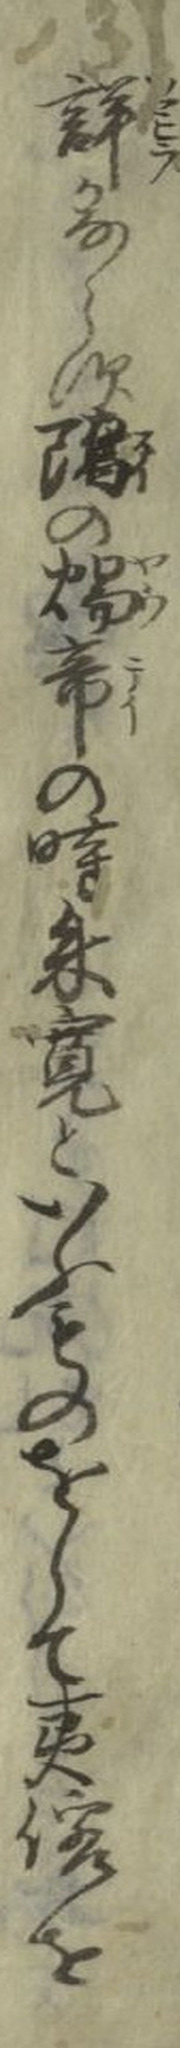詳かならす隋の煬帝の時朱寛といふものをして夷を
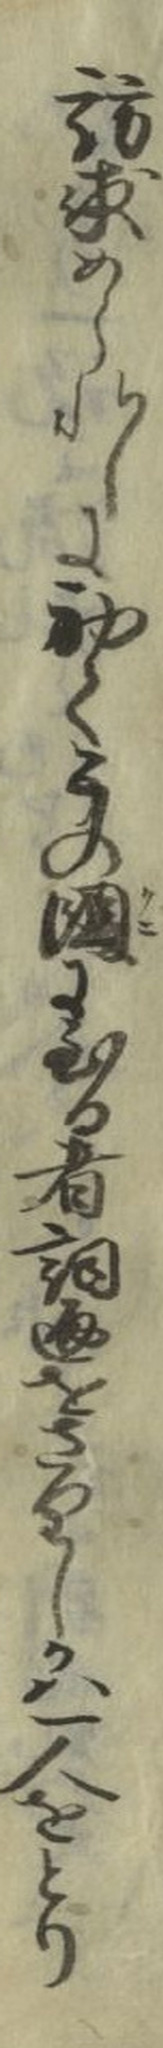訪求められしに初てその国に至る者調通をさりしかは一人をとり
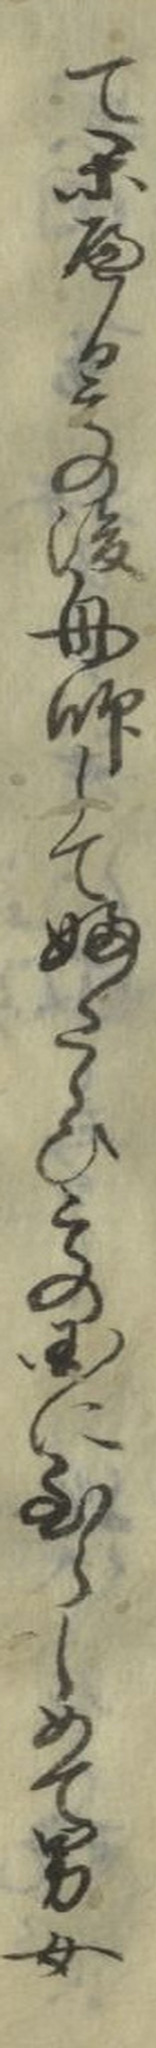て閑へるその後舟帰してふたゝひその国に至らしめて男女
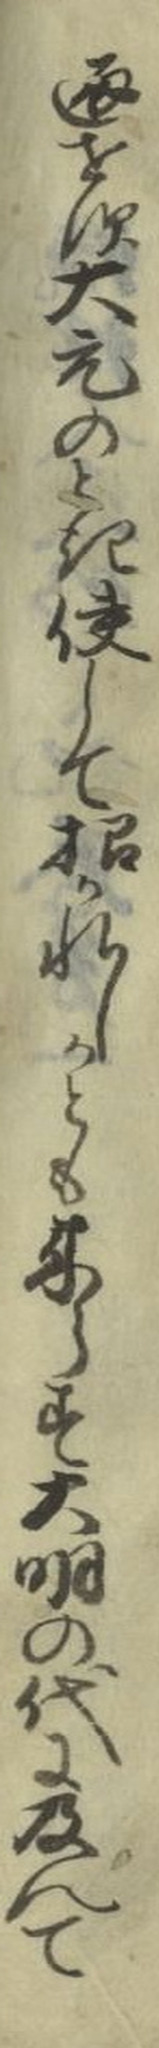通さす大元のとき使して招かれしかとも来らす大明の代に及んて
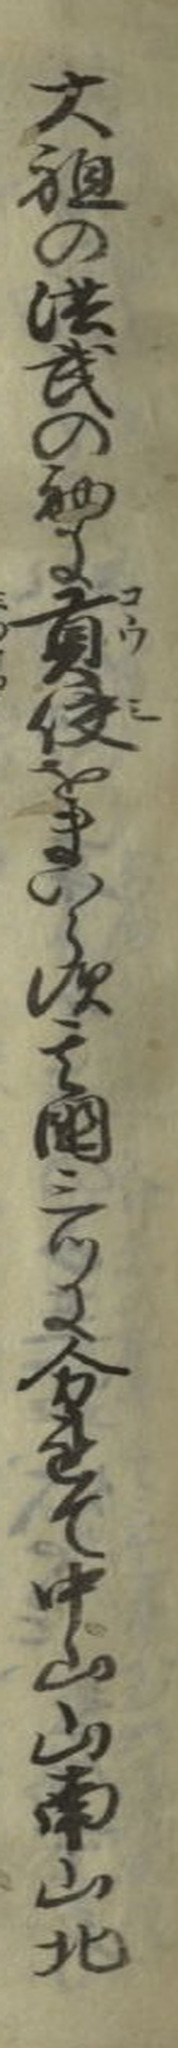太祖の洪武の初に貢使をまいらす其国三川に分れて中山山南山北
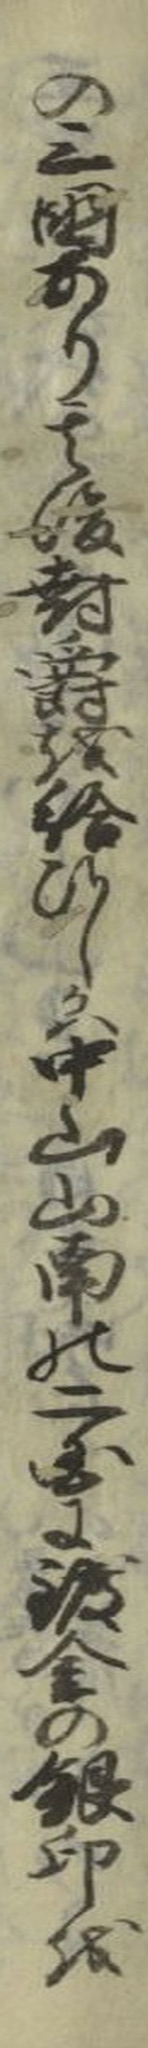の三国あり其後封爵を給ひしかは中山山南の二国に鍍金の銀印を
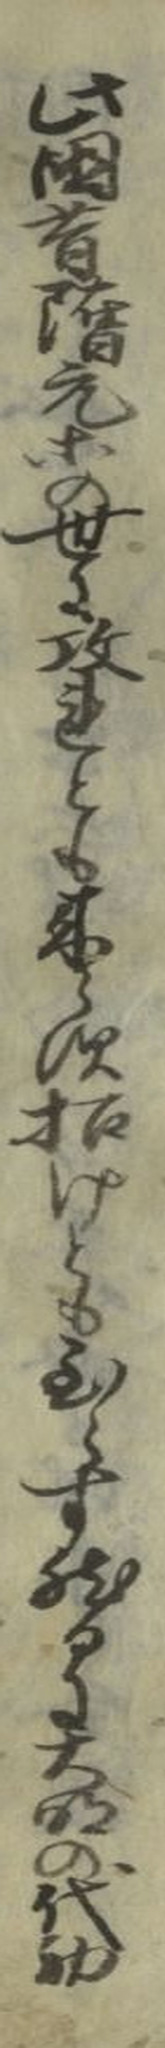此国昔隋元等の世に攻められとも来らす招けとも至らす然るに大明の代舡
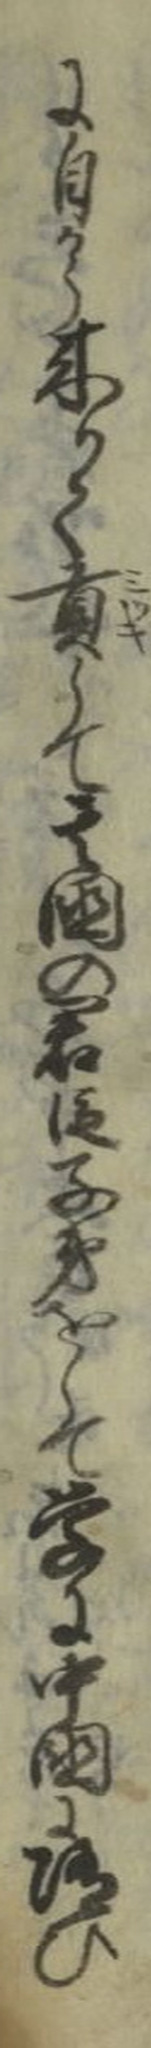に自から来りて貢して其国の君臣子弟をして学に中国に随ひ

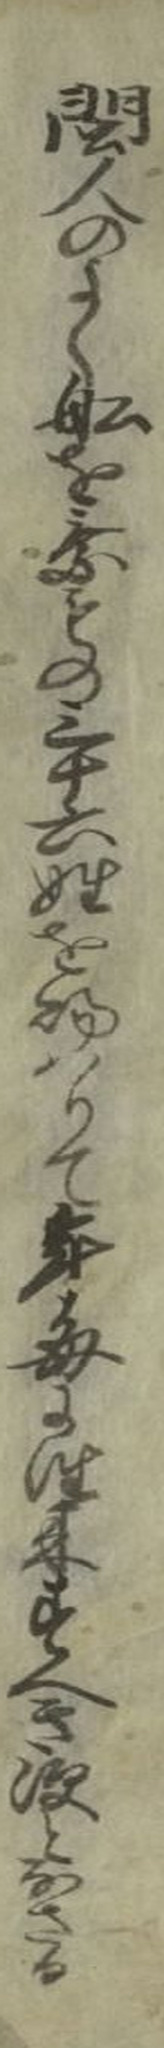閩人のよく舩を乗もの三十六姓を賜はりて年毎に往来すへき便となさる
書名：琉球人来朝之記
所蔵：University of the Ryukyus Library
